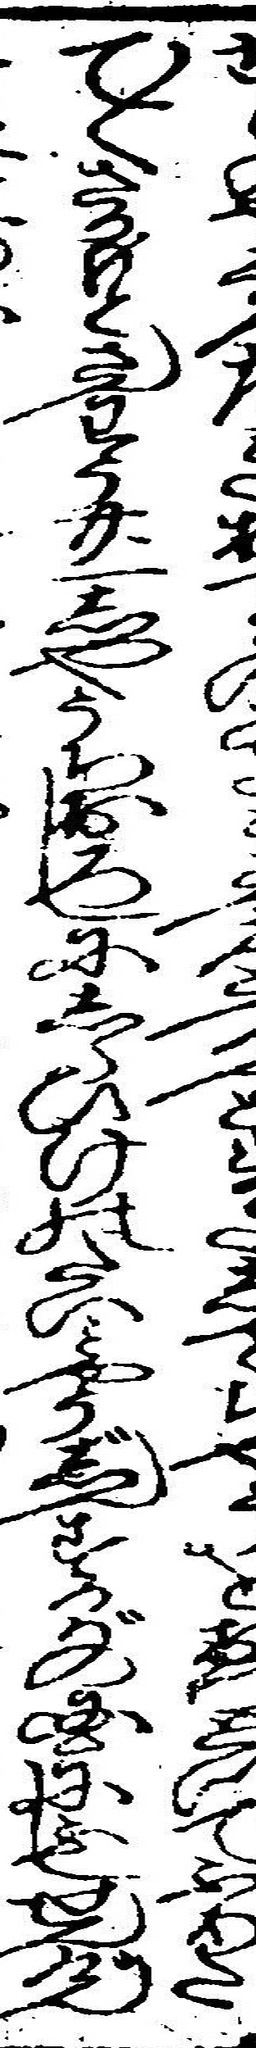て〳〵さかもとさんわう廿一しやうちおろしにしらひけのたいみやうじんするがの国にふしせんげん
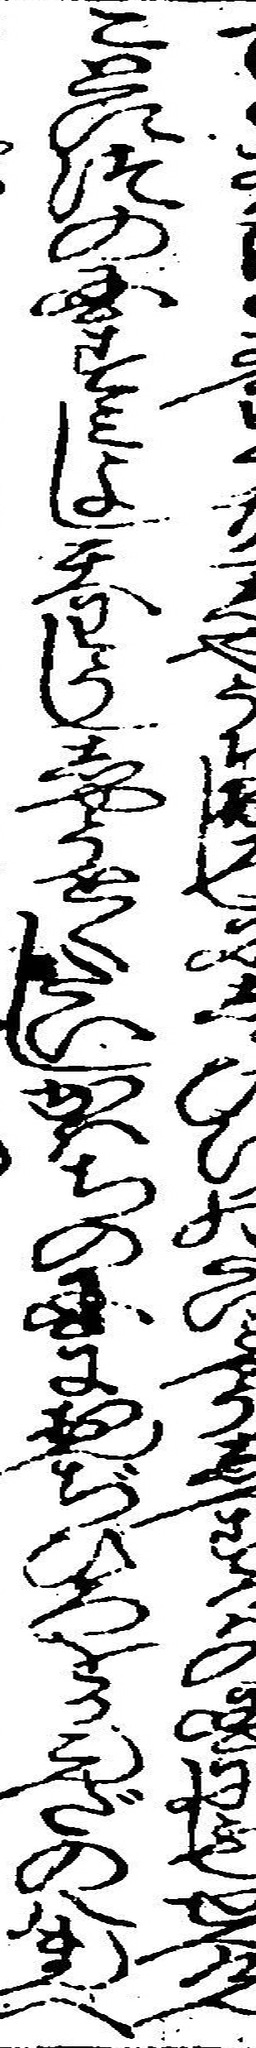ことにつの国すみよし天わうししやうとくたいしかはちの国におんぢひろをかこんだ八まんへ
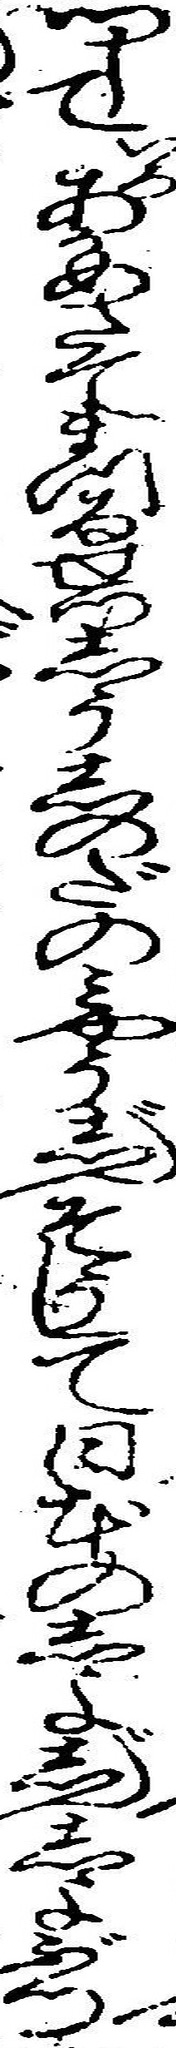つしていろあかめたてまつるせつしうしのだのみやうじんそうして日本のしよじんしよぶつ
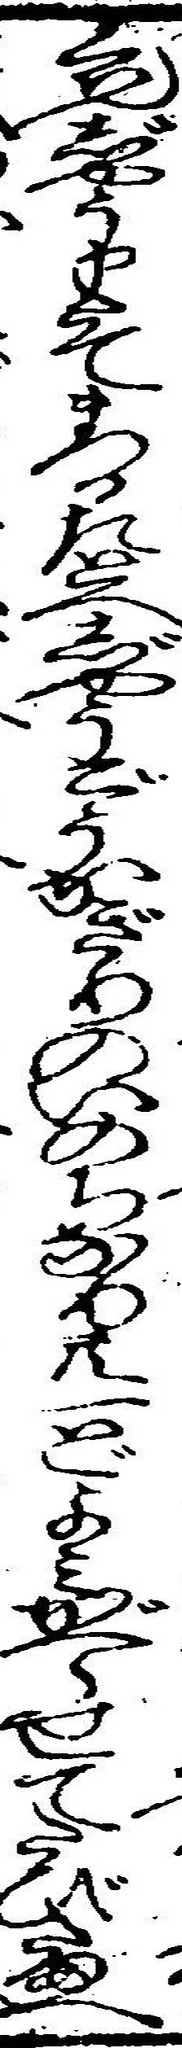くはんじやう申たてまつるたとへじやうごうかぎりのいのちなり供一どよみがへらせてたびたまへ
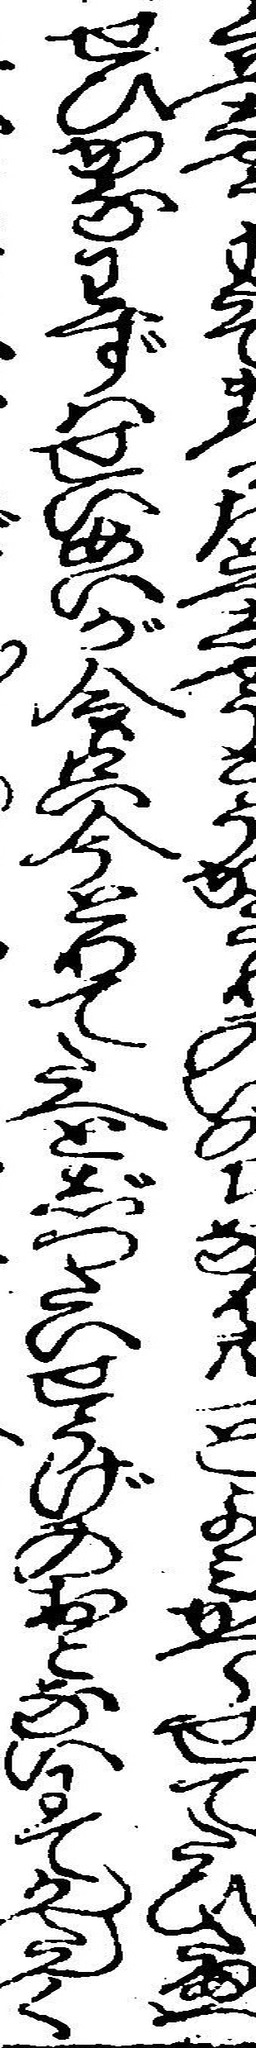せひかなわずはせいめいが命只今とりてたへとじつたいせうげのおこないにてかんたんく
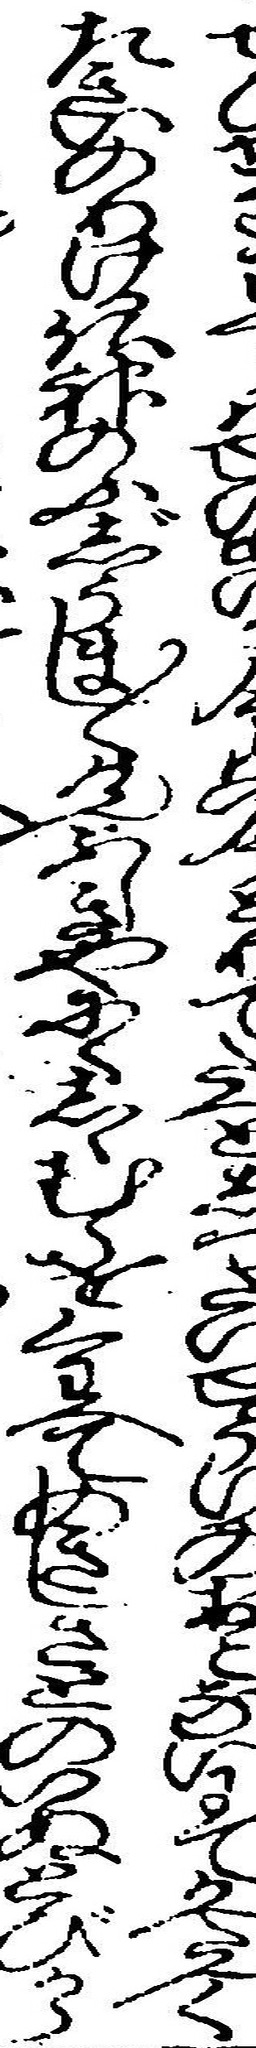たきいのりける仏神のふじうまし〳〵けんふしきやにくしゝむらをくわへてのきしさとのいぬとびから
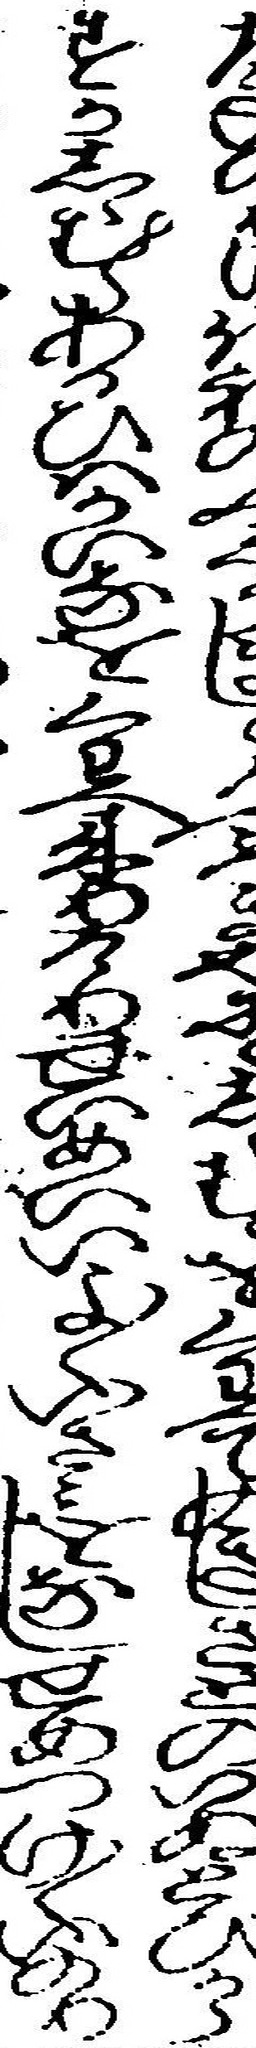すかしゝむらあるひはかいなをくわへ来りけりせいめいいよ〳〵いさみをなしせめつけ〳〵いのり
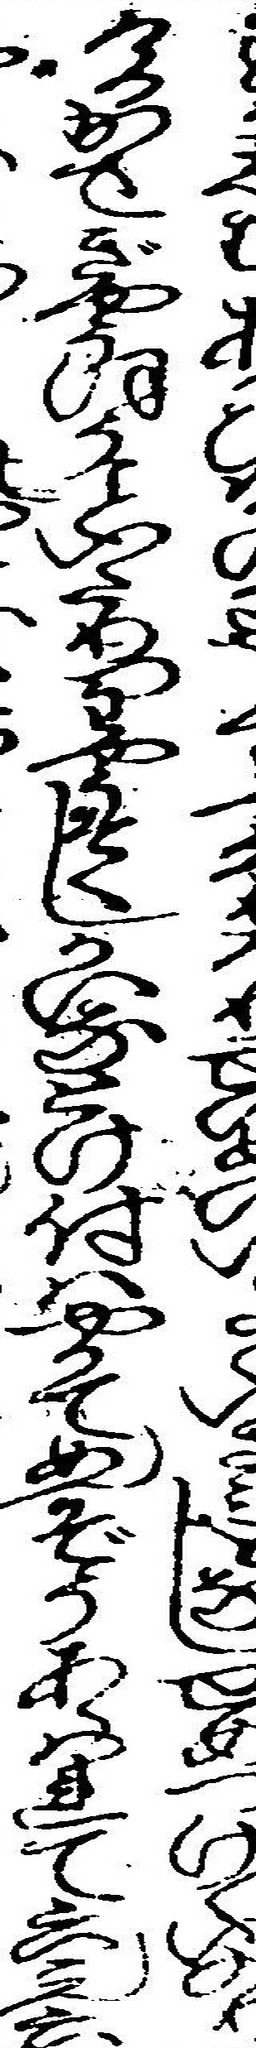けるかくてぎやうほうこといたりりやうそくしかいなとけ付はやかてめんぞうあらはれて六こん六
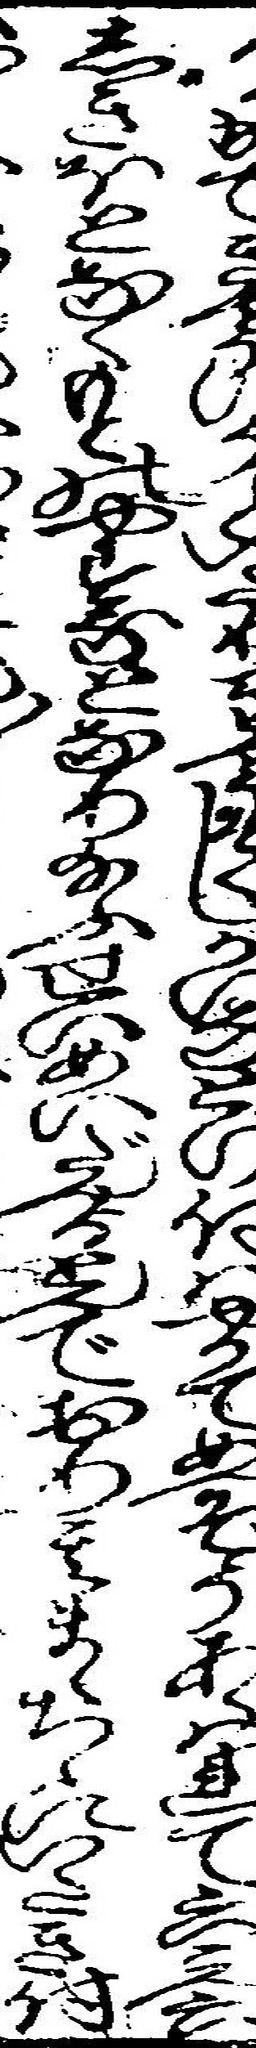しきほとなくもとのやすなとなり給ふせいめいだんゟとんでおり其まゝちゝにいたき付
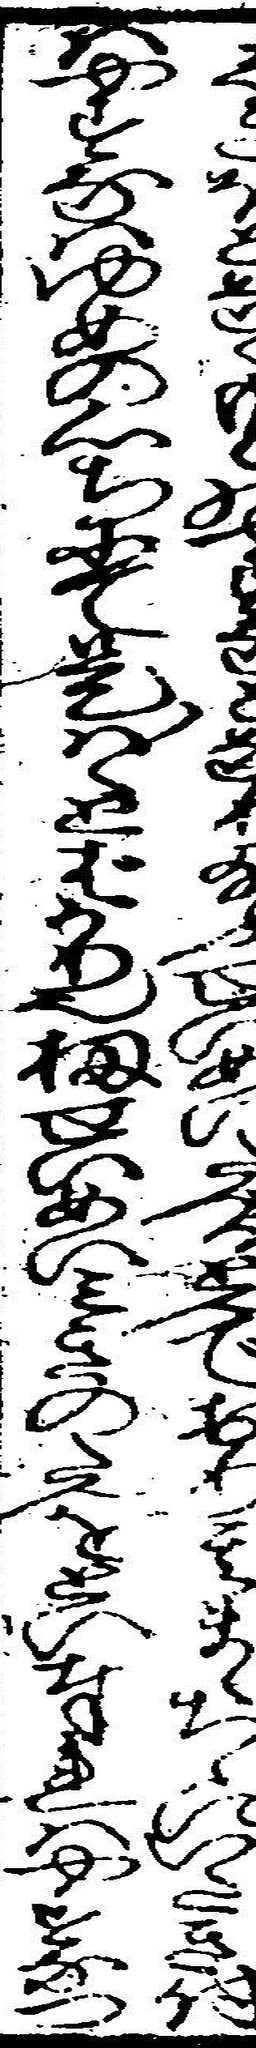はやすなはゆめの心ちにて是は〳〵とばかり也扨せいめいみきのたんをとい奉れはやすなつ
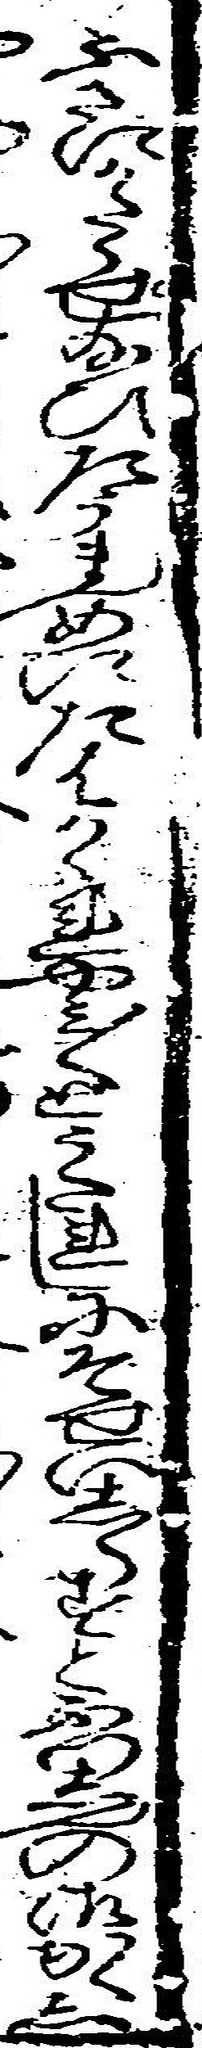ふさにかたらせ給ひたうまんめにたはかられやみ〳〵とうたれしにそせいしらすとふつしんの御かくし
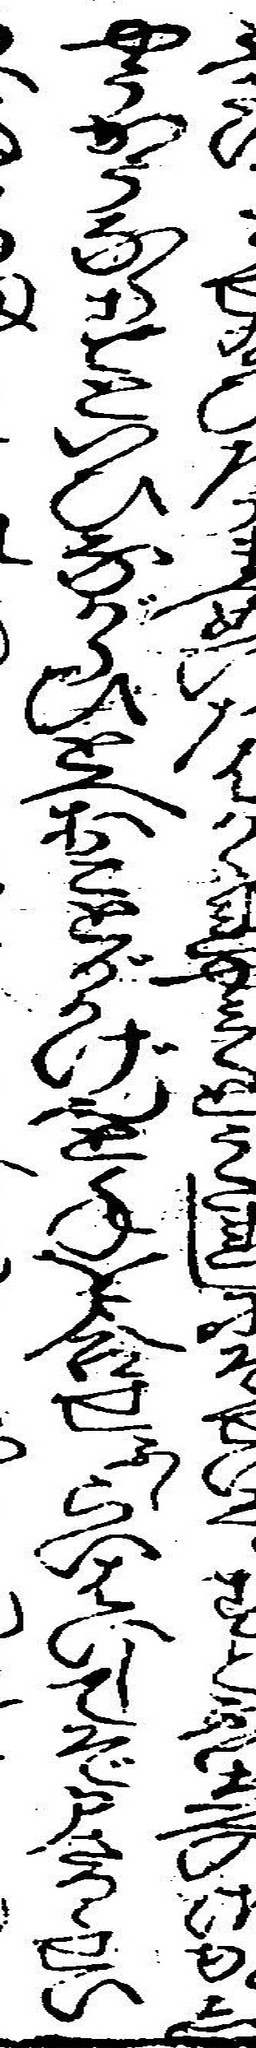やうかうならすといひながらひとへおことがかげ也と手を合わせふしらいはいしてぞ申さるゝせい
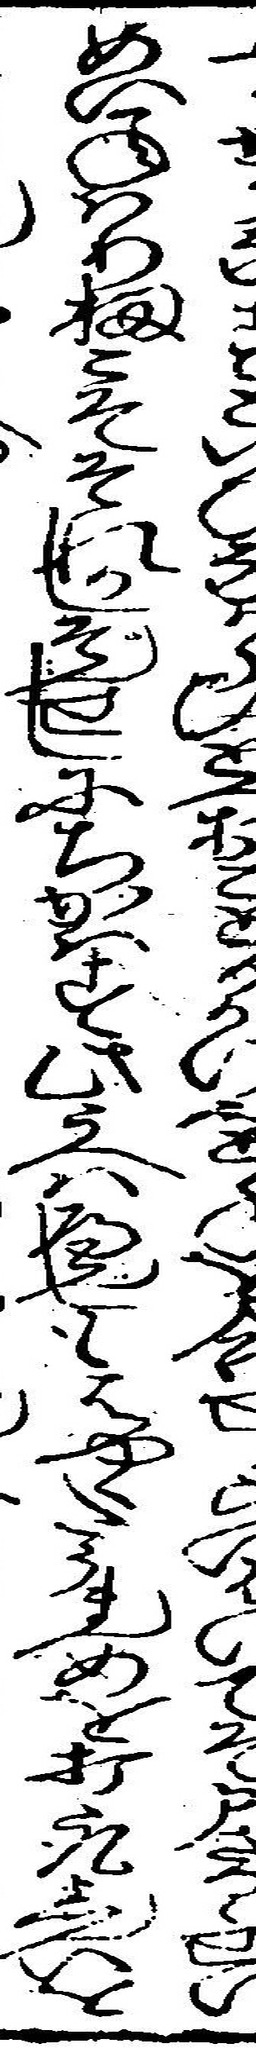めい承はり扨こそそれかしぞんせしにちかはす此うへはへんしもはやくたうまんめを打取しんいを
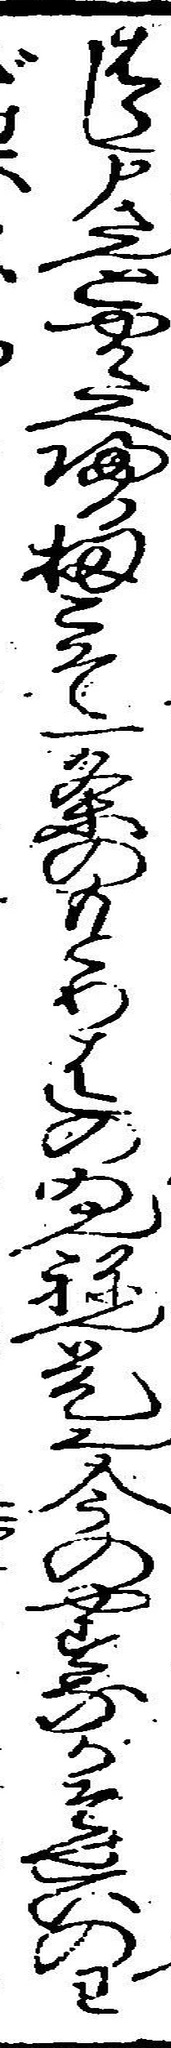はらし申さんとやかたへ帰る扨こそ一条のもとりはしのゐんねん是也今のやすなかそせいのわ
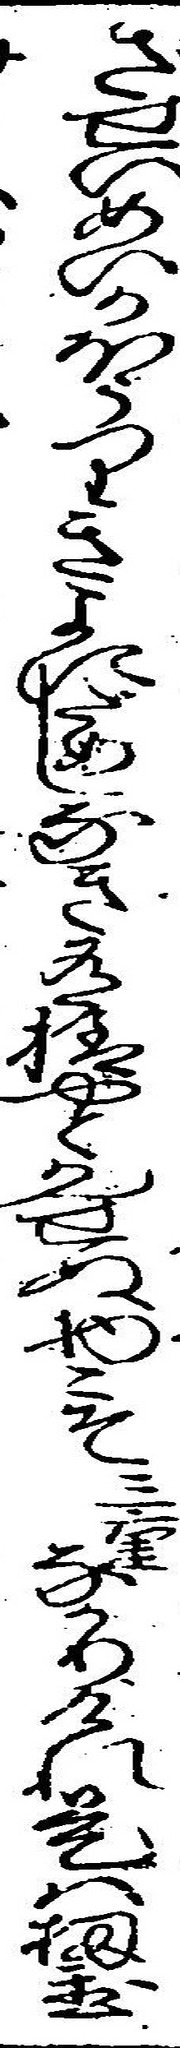ざせいめいかほうりきよにためしなき有様やとかんせぬ物こそ三重なかりけれ是は扨置
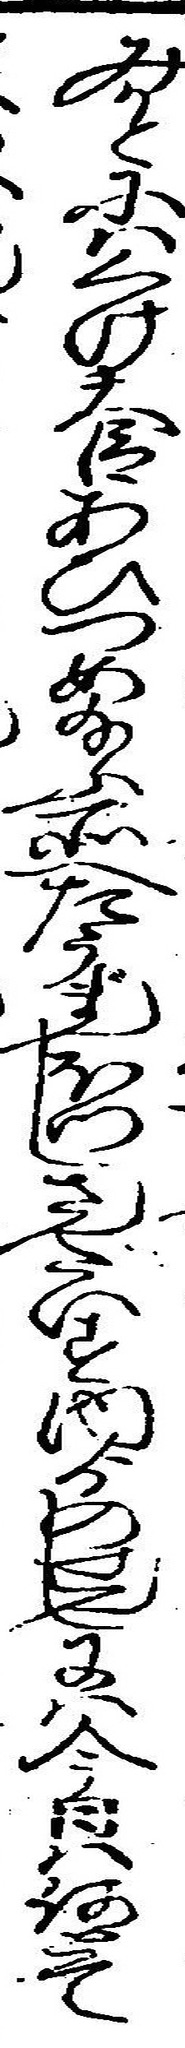みかとにはくけ大臣あひつめ給ふ所へだうまんほつしさんだいす内ゟのせんしには今日は何とて
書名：[しのだづまつりぎつね付あべの清明出生]
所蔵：東京大学総合図書館 General Library in the University of Tokyo, JAPAN
